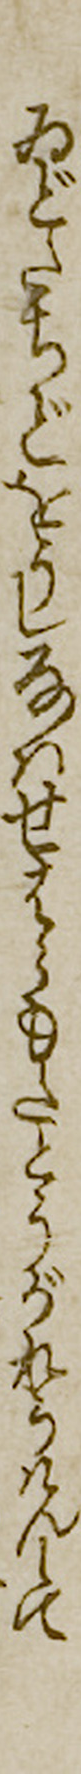ゐどたちどをうしないせはらもたとうがれうけんして
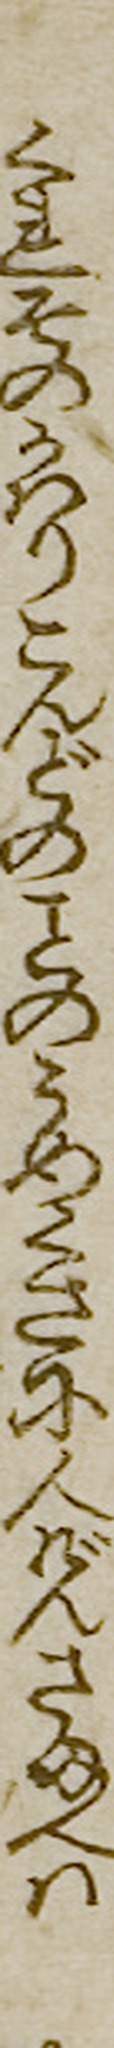くれそのかはりこんどのことのうめくさに人げんさまへは
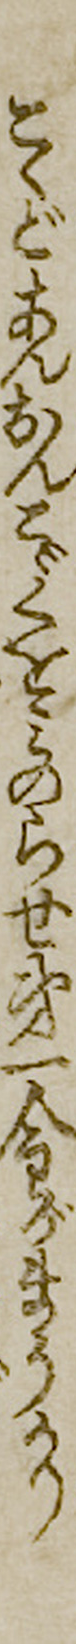こくどあんおんこごくをみのらせ第一金がまうかり
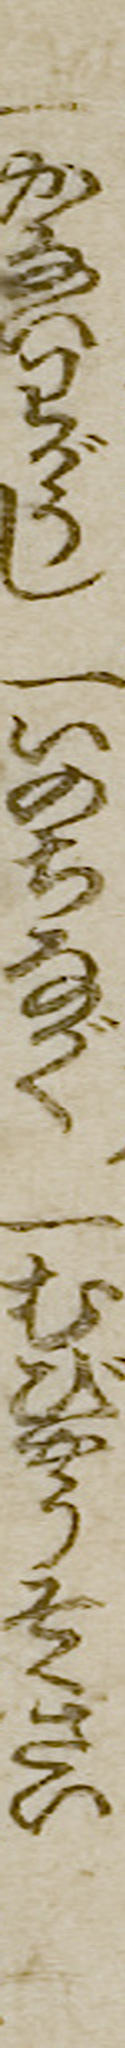一かないわがうし一いのちながく一むびやうそくさい
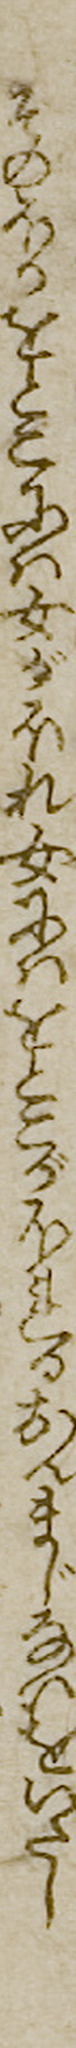そのほかをとこには女がほれ女にはをとこがほれるおんまじないをいたし
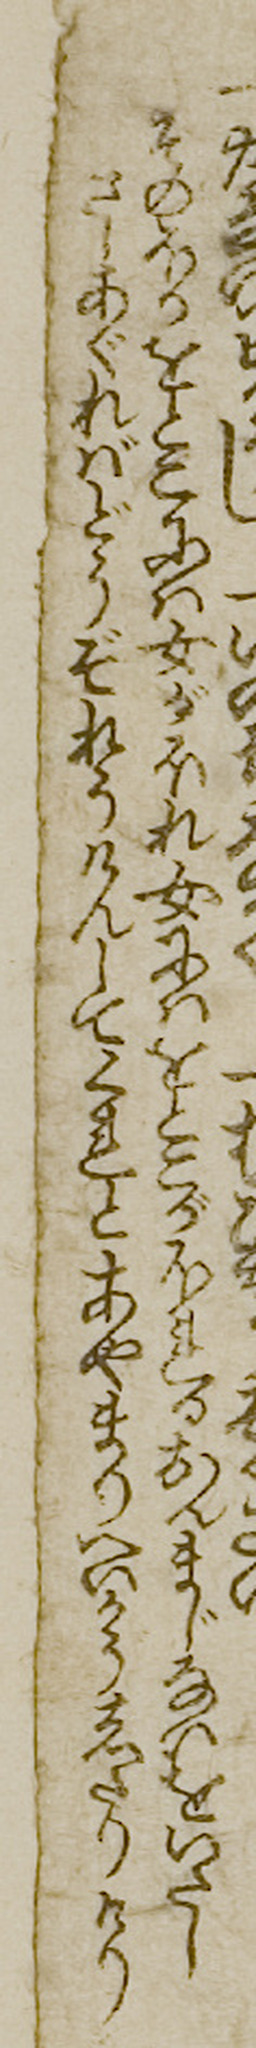さしあぐればどうぞれうけんしてくれとあやまりへいかうしたりけり
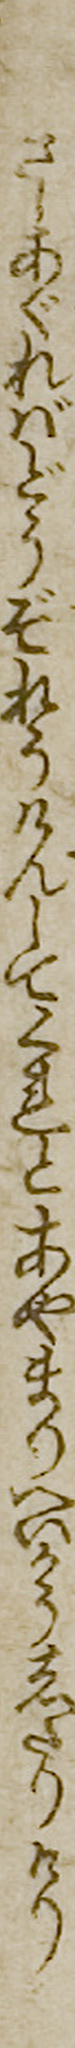さしあぐればどうぞれうけんしてくれとあやまりへいかうしたりけり
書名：万歳楽鯰の後悔
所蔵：東京大学総合図書館 General Library in the University of Tokyo, JAPAN
